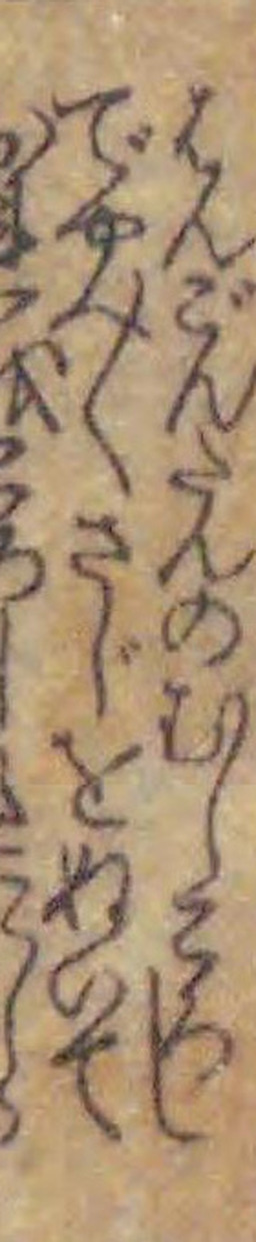でやへ〳〵さじをぬいて
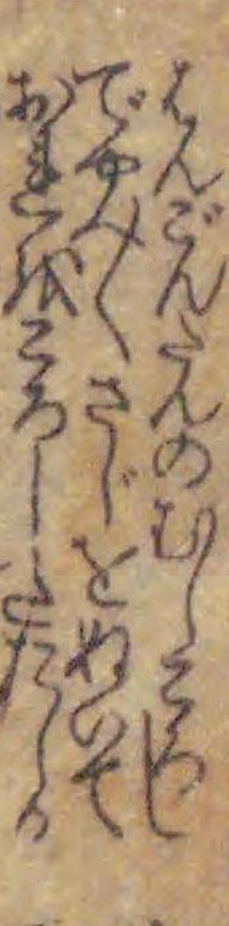おれをころしたたしか
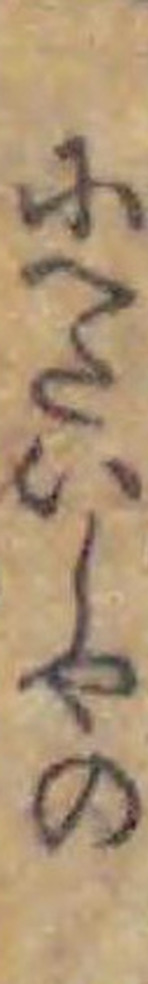にへたいしやの
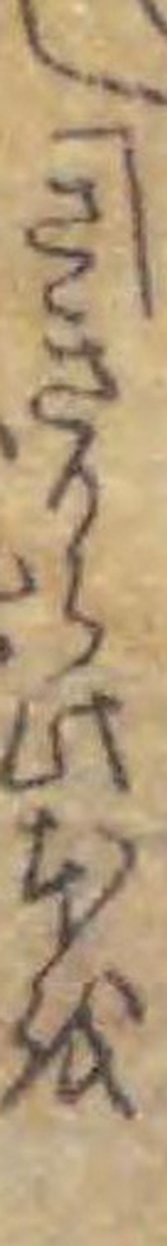〽さきから此本を
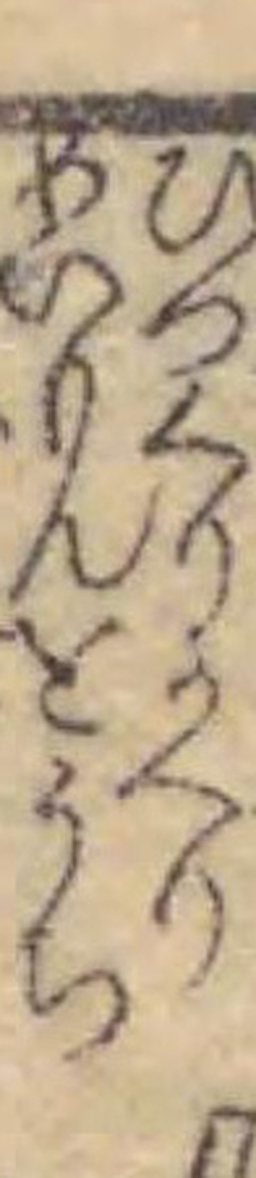めいもんをうち
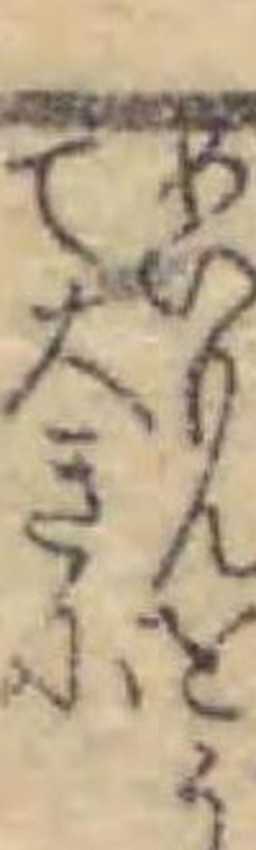て大きに
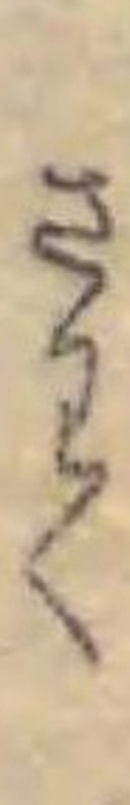さわく
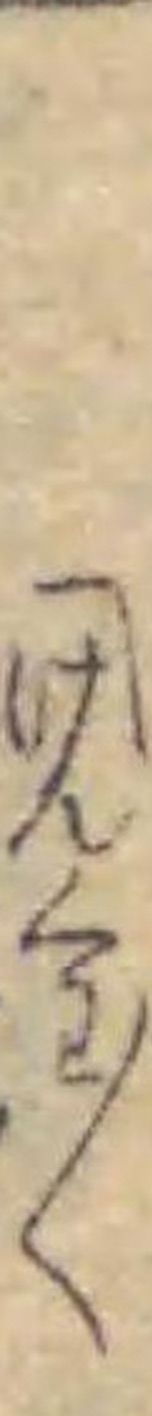〽けんくわ〳〵
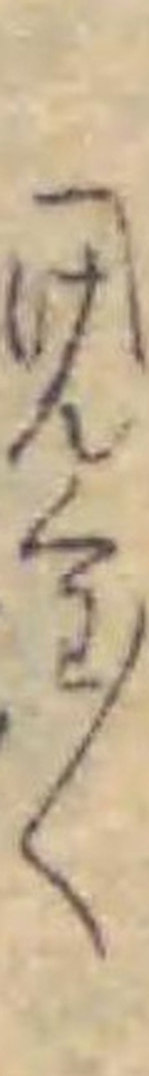〽けんくわ〳〵
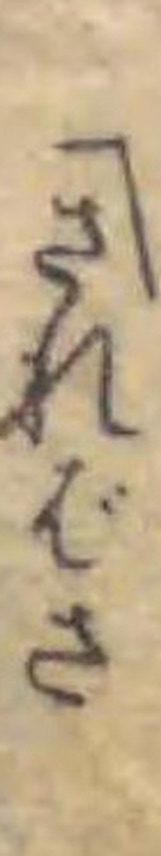〽さればさ
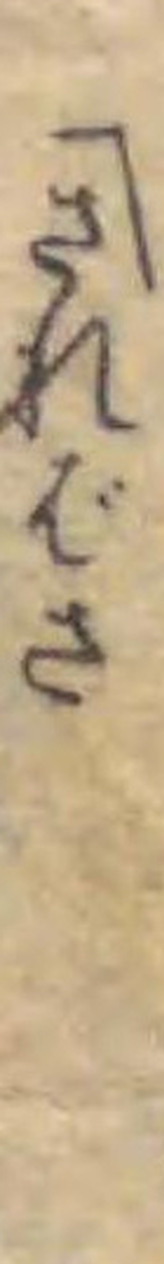〽さればさ
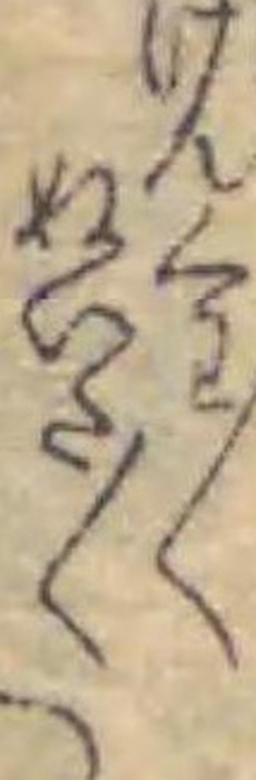ぬいた〳〵
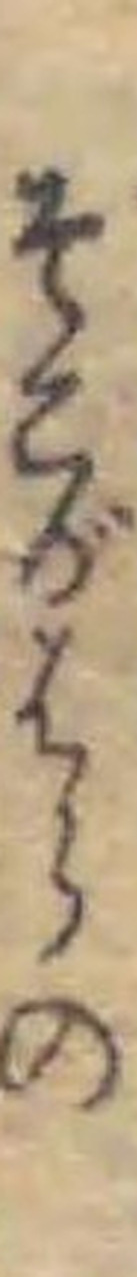そこがはらの
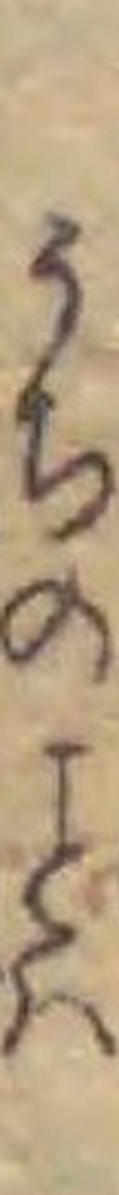うちのことは
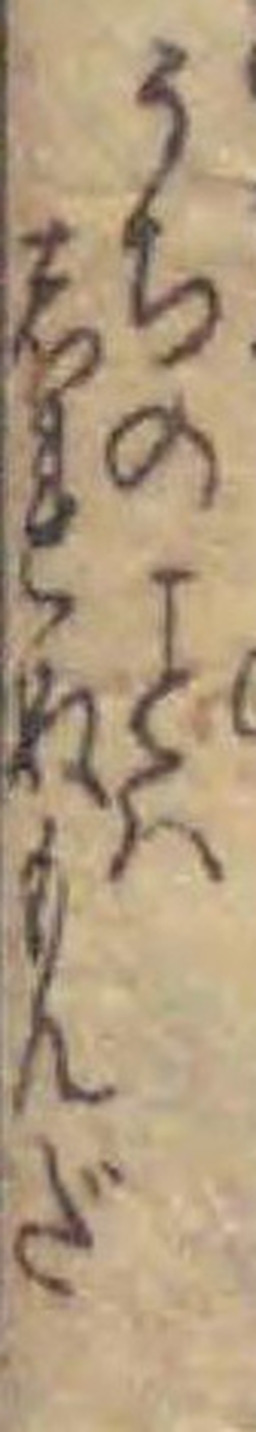しれぬもんだ
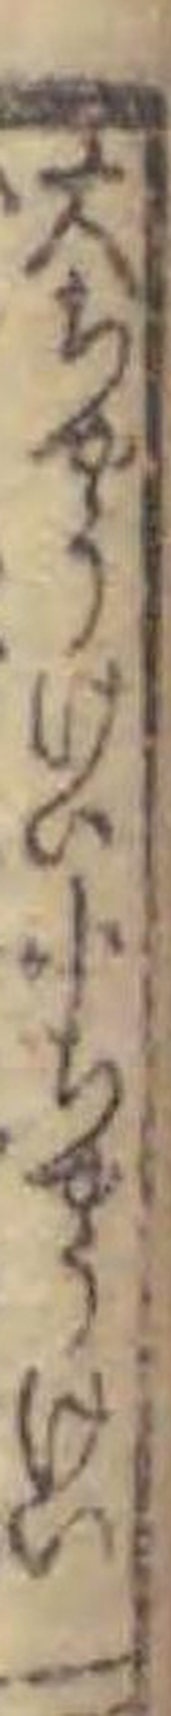大ちやうけい小ちやうけい
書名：十四傾城腹之内 : 3巻
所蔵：国立国会図書館 National Diet Library, JAPAN
